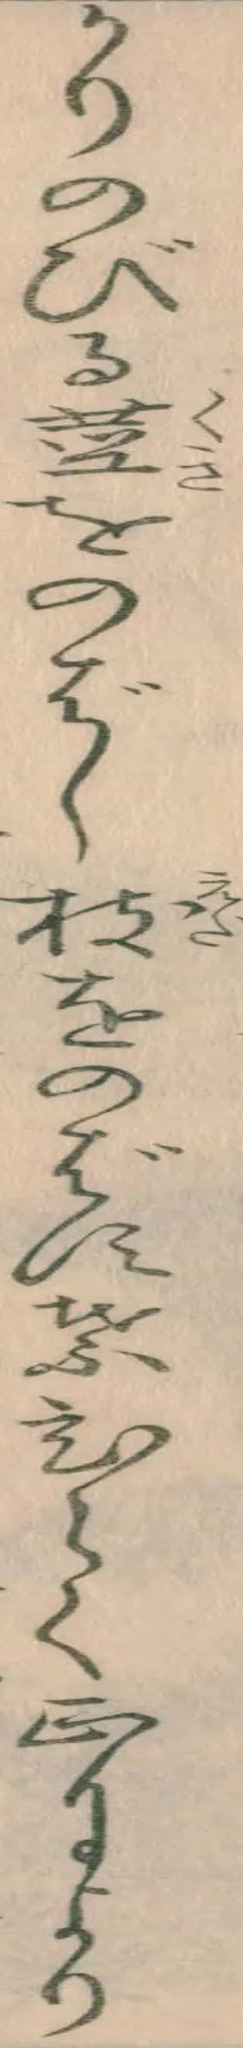かりのびる茎をのばし枝をのばす葉ひらく正月より
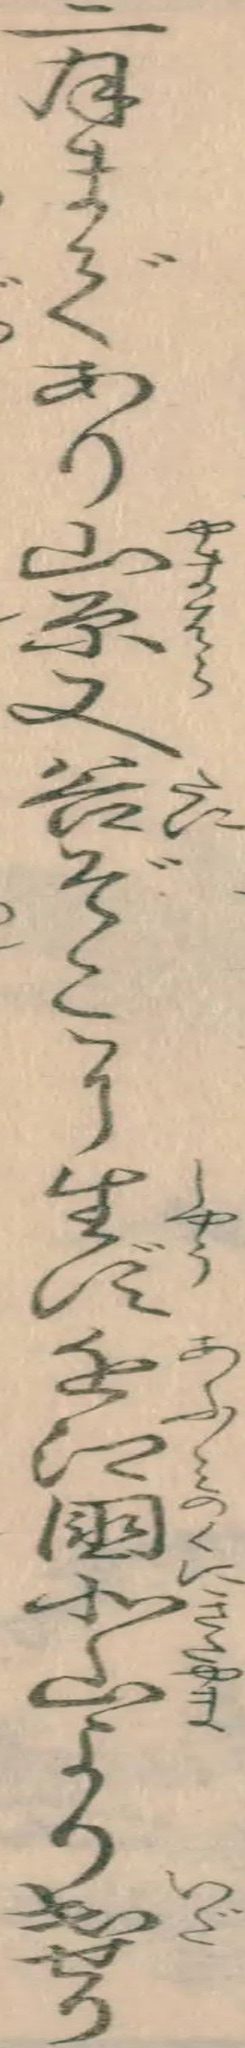二月まであり山原又谷ぞこに生ず近江国北山より出せり
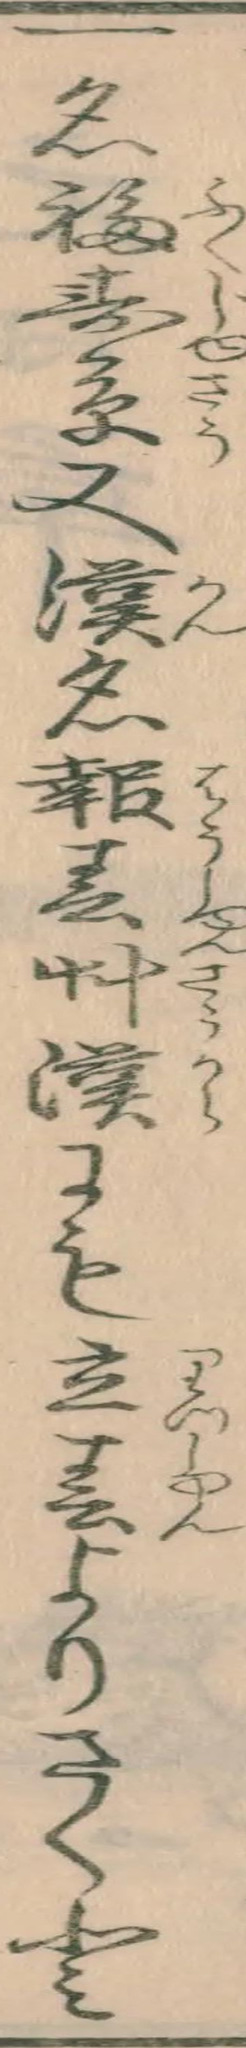一名福寿草又漢名報春艸漢にも立春よりさくと
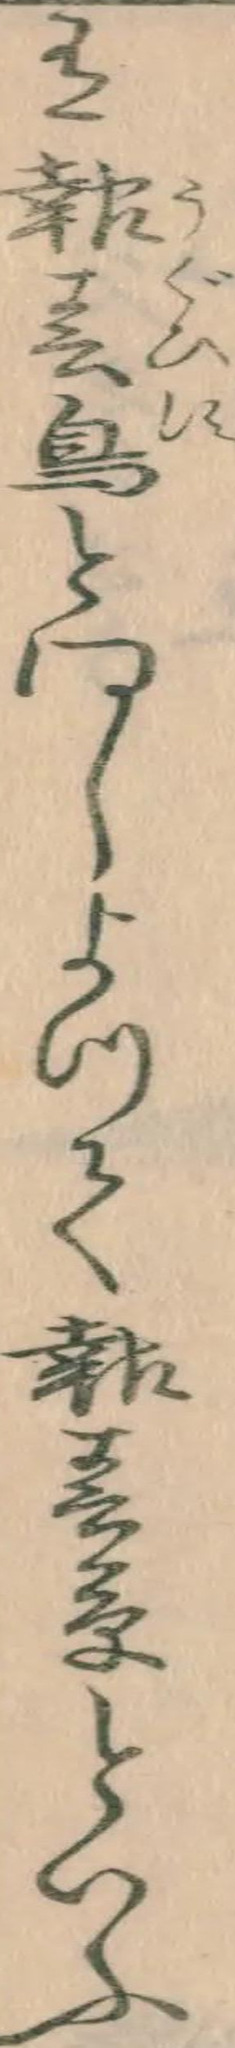有報春鳥と同しよつて報春草といふ
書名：畫本野山草. [4]
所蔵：国立国会図書館 National Diet Library, JAPAN
